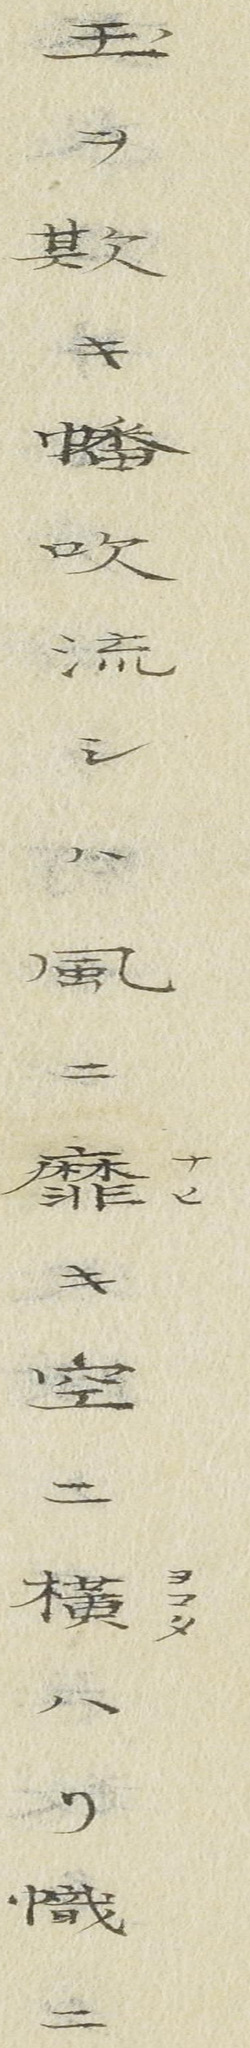玉ヲ欺キ幡吹流シハ風ニ靡キ空ニ横ハリ幟ニ
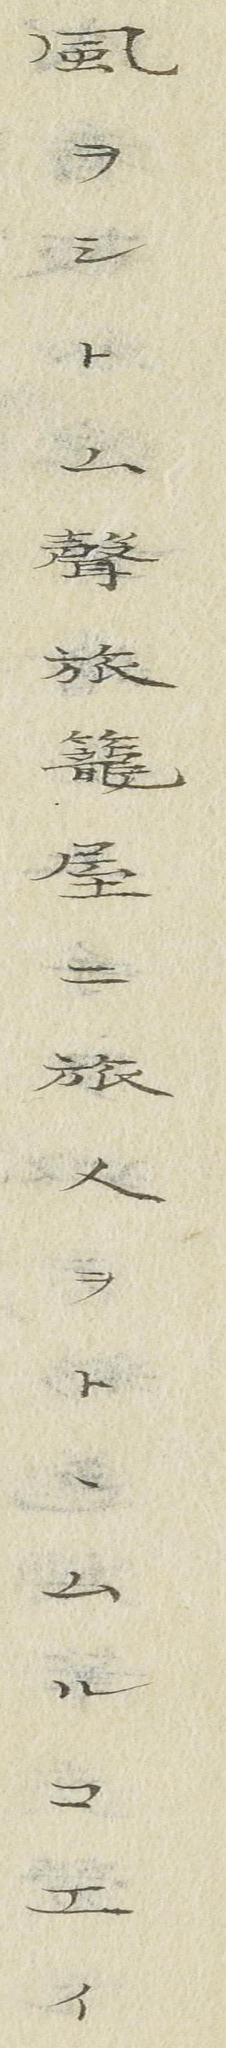風ヲシトム声旅籠屋ニ旅人ヲトヽムルコエイ
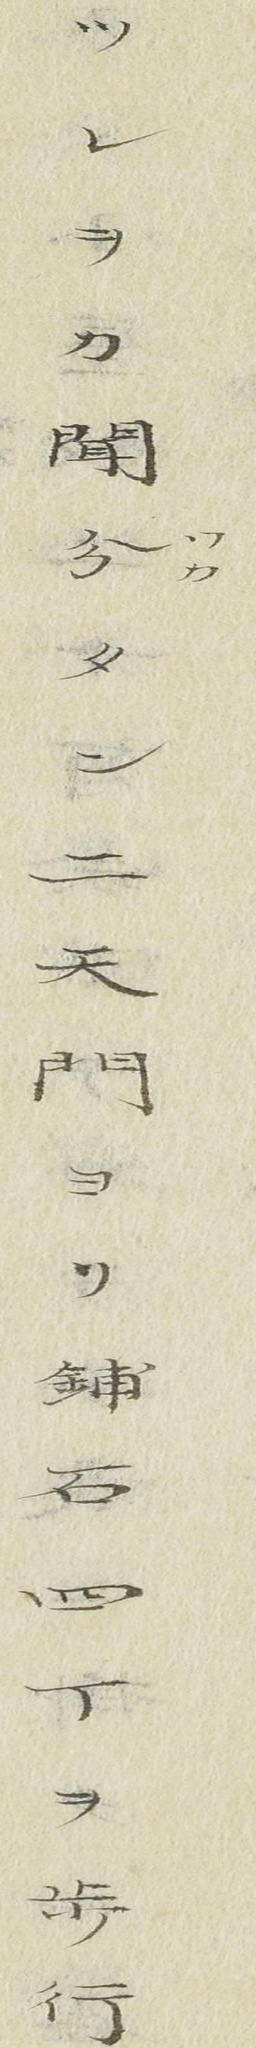ツレヲカ聞分タンニ天門ヨリ鋪石四丁ヲ歩行
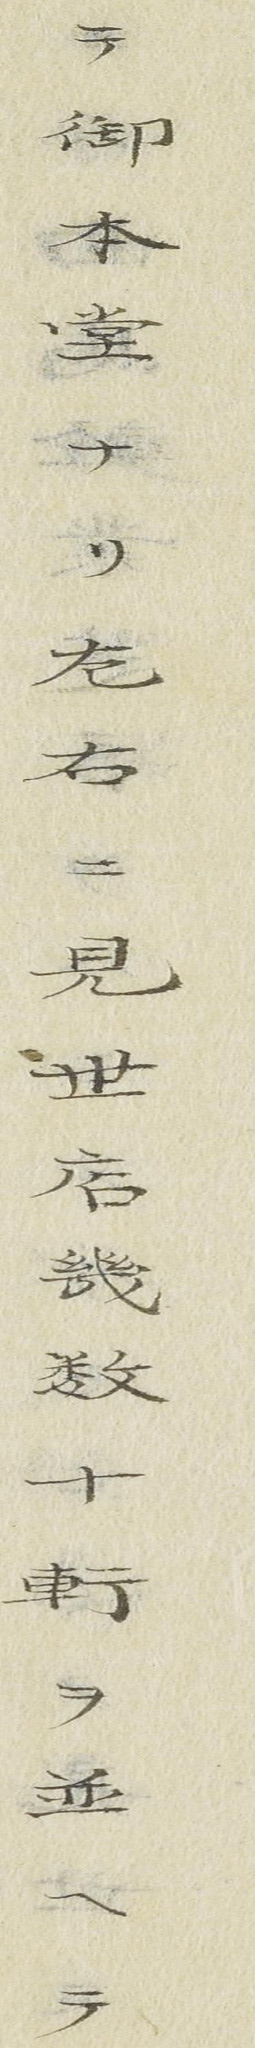テ御本堂ナリ左右ニ見世店幾数十軒ヲ並ヘテ
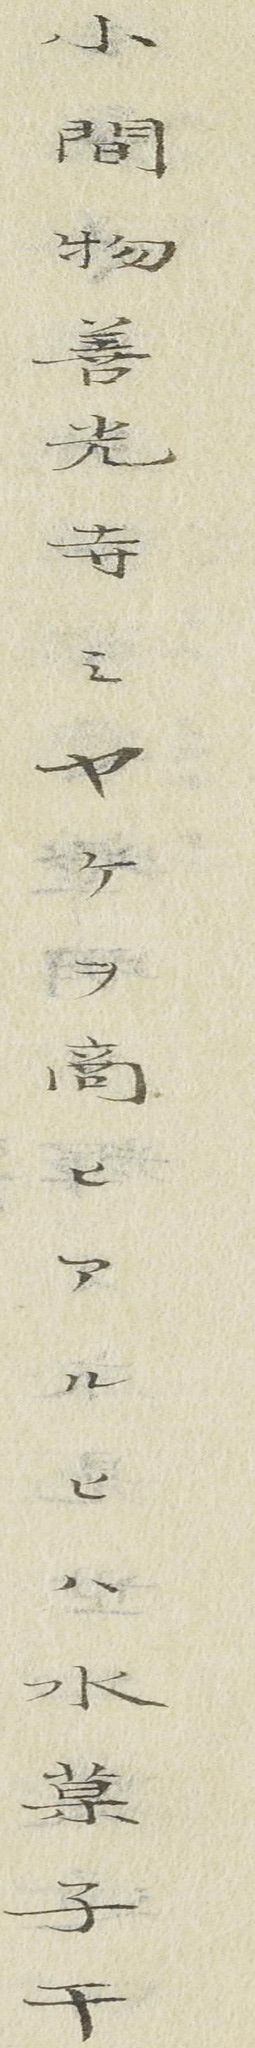小間物善光寺ミヤケヲ商ヒアルヒハ水菓子干
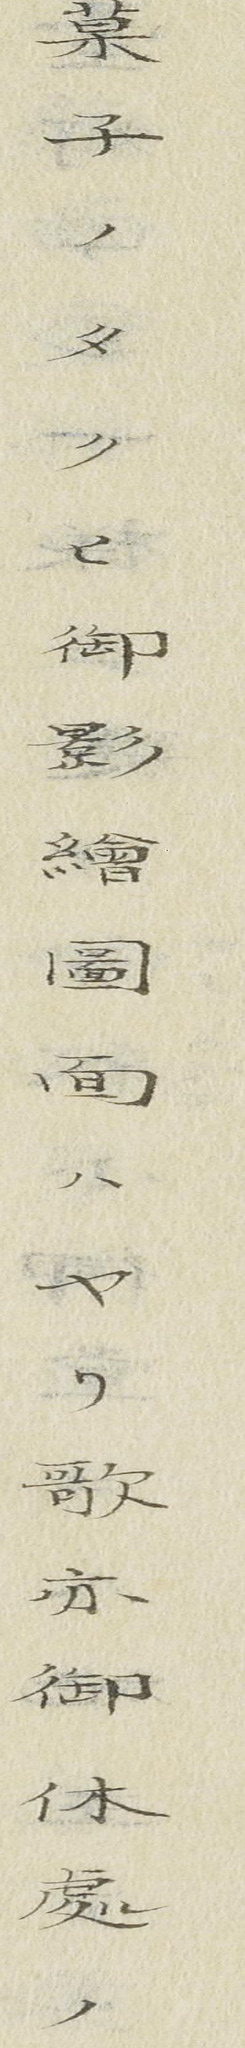菓子ノタクヒ御影絵図面ハヤリ歌亦御休処ノ
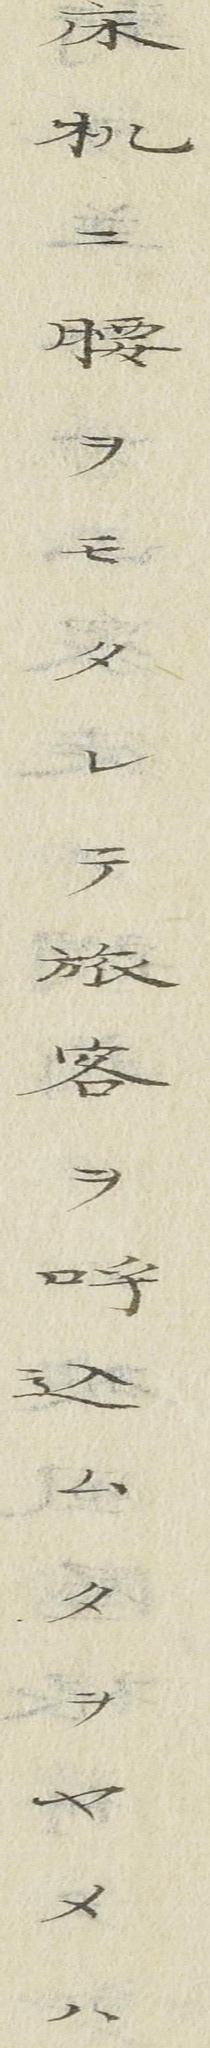床机ニ腰ヲモタレテ旅客ヲ呼込ムタヲヤメハ
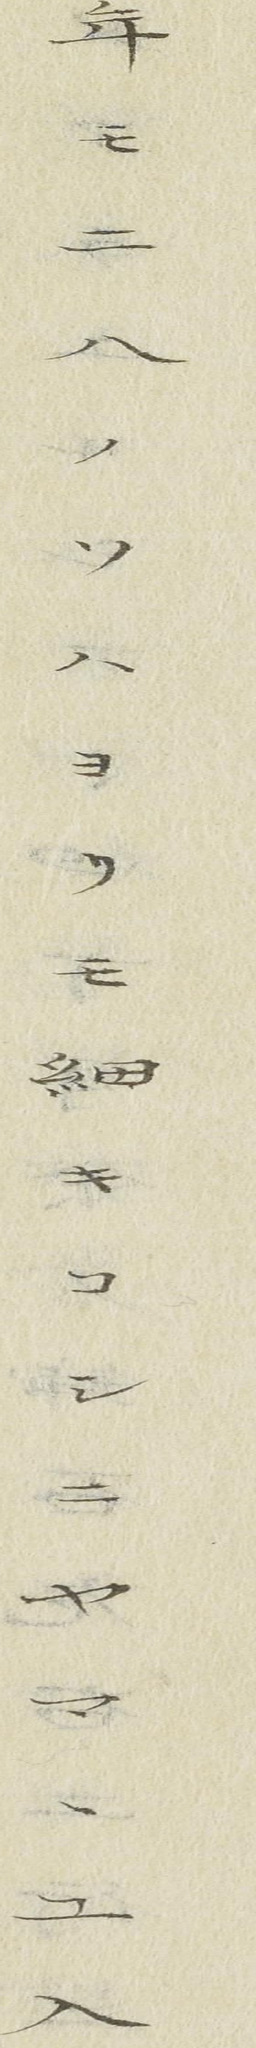年モ二八ノソハヨリモ細キコシニヤマヽユ入
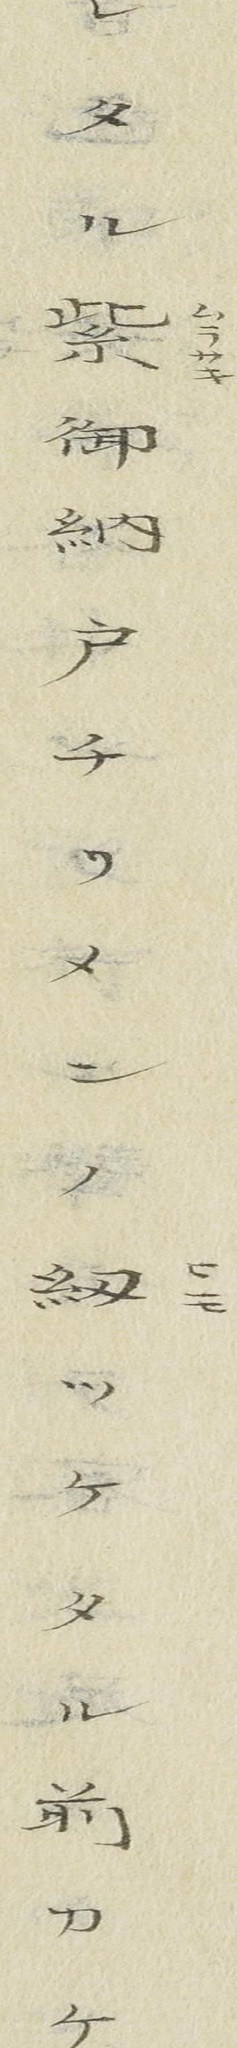レタル紫御納戸チリメンノ紐ツケタル前カケ
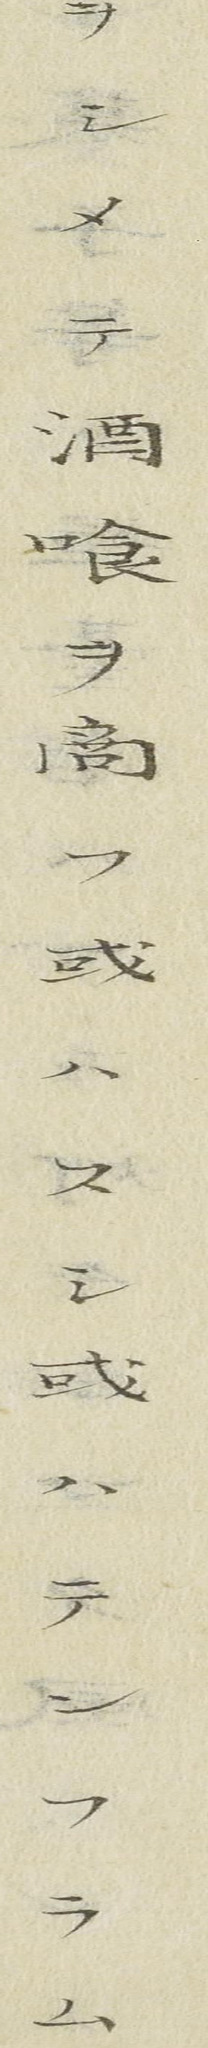ヲシメテ酒喰ヲ商フ或ハスシ或ハテンフラム

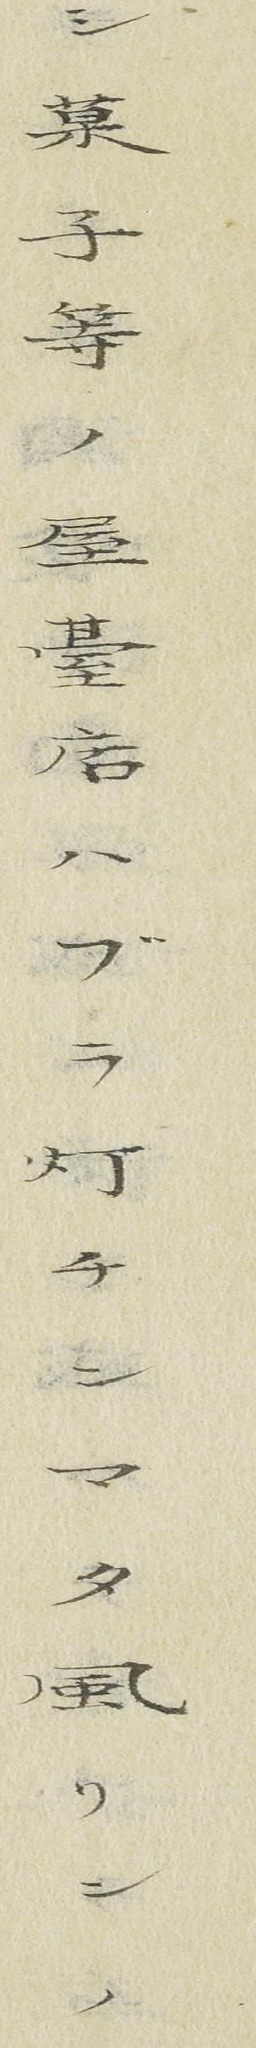シ菓子等ノ屋台店ハブラ灯チンマタ風リンノ
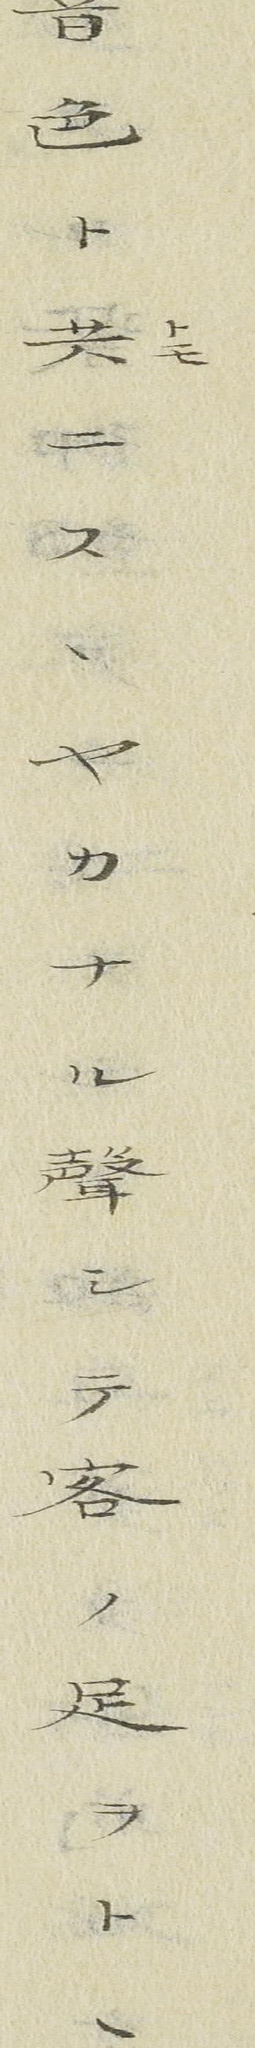音色ト共ニスヽヤカナル声シテ客ノ足ヲトヽ
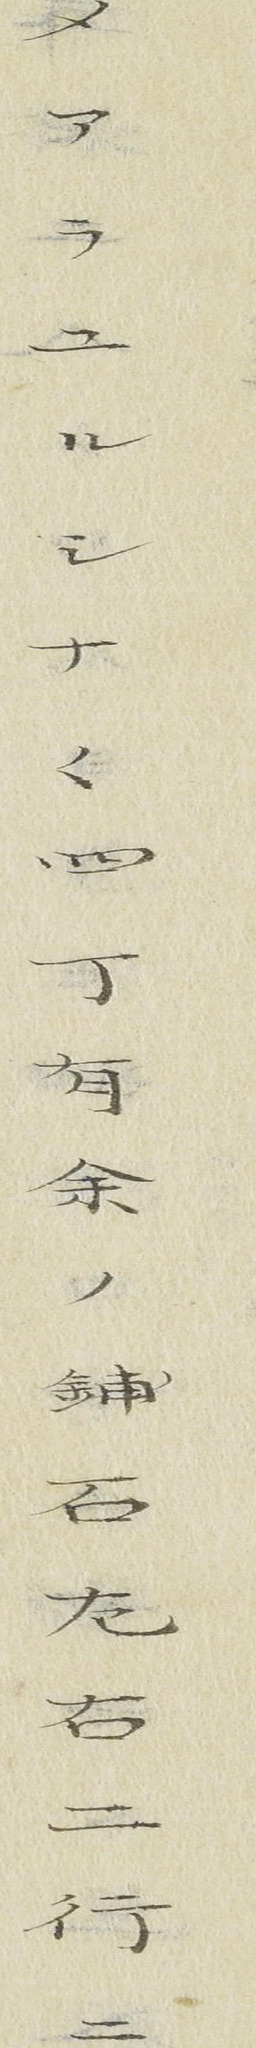メアラユルシナ〱四丁有余ノ鋪石左右ニ行ニ
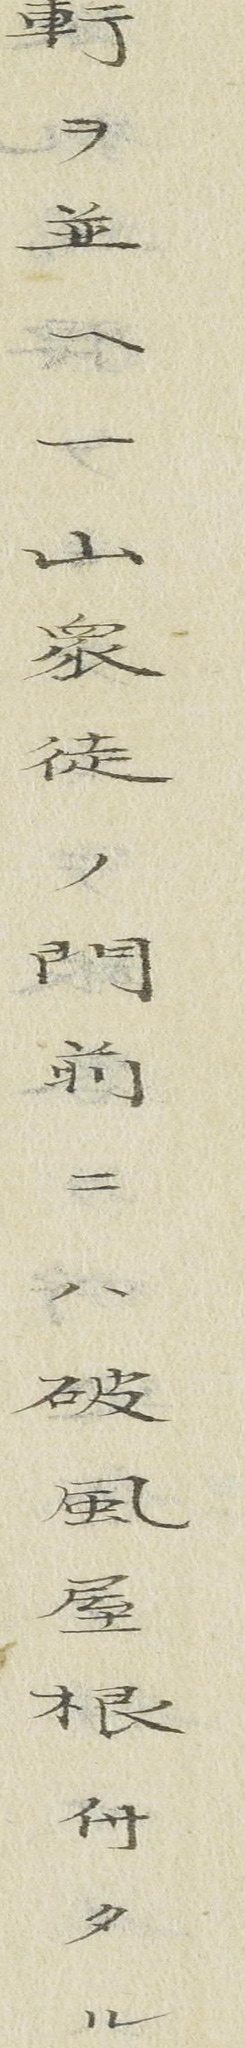軒ヲ並ヘ一山衆徒ノ門前ニハ破風屋根付タル
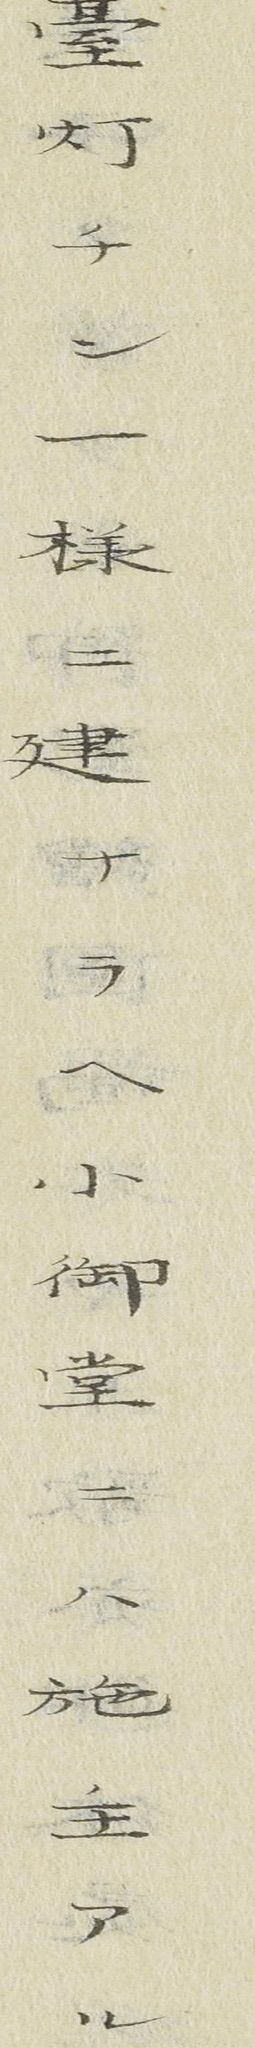台灯チン一様ニ建ナラヘ小御堂ニハ施主アル
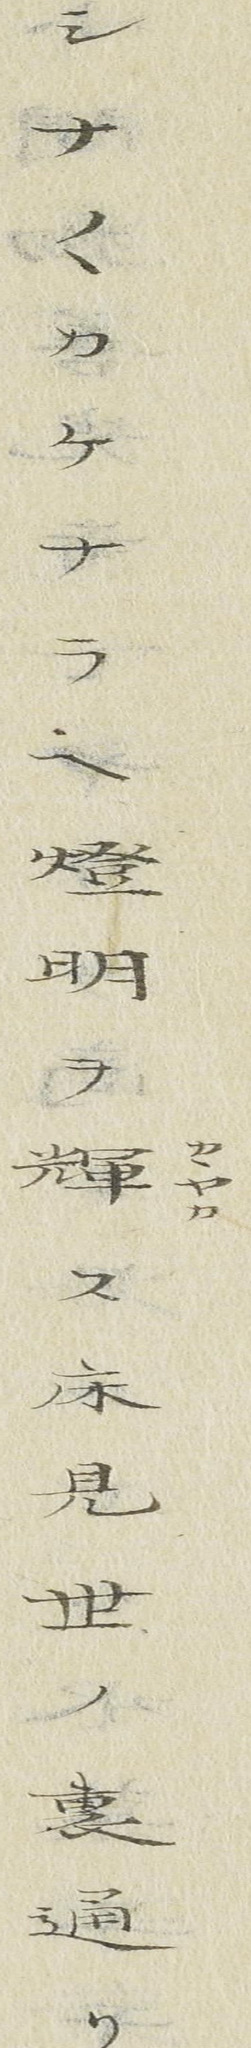シナ〱カケナラヘ燈明ヲ輝ス床見世ノ裏通リ
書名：地災撮要　地震之部　巻ノ二
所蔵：東京大学地震研究所図書室 Earthquake Research Institute Library, The University of Tokyo, JAPAN
